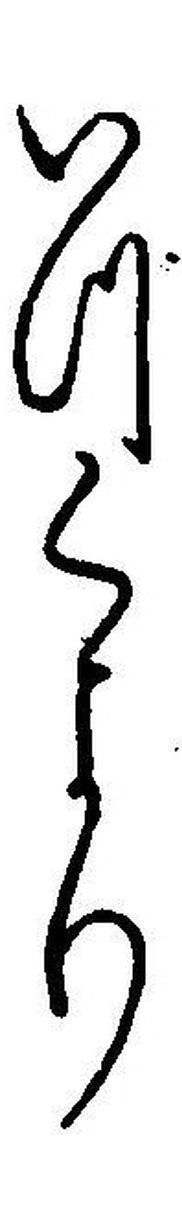いづくより
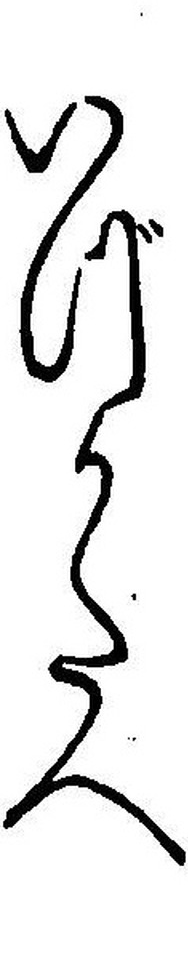いづかたへ
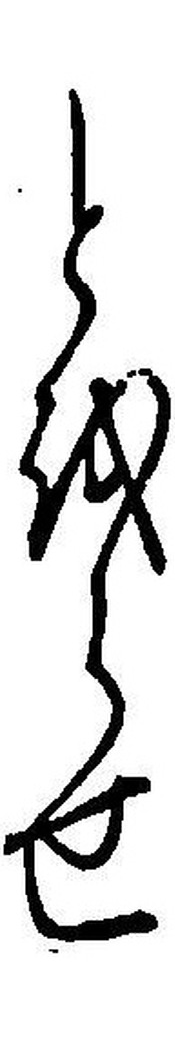とをらせ
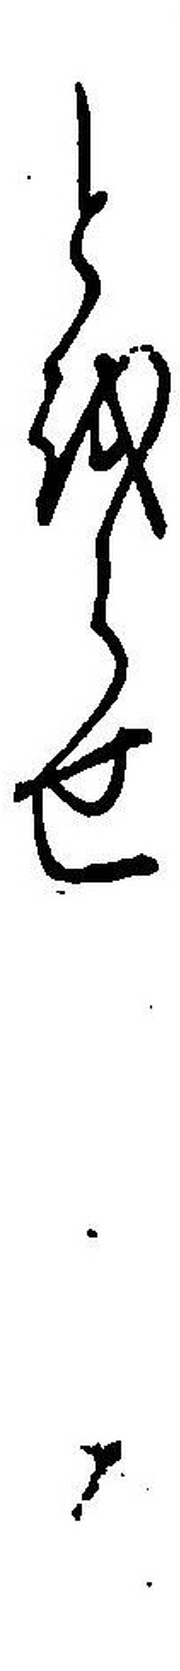とをらせ
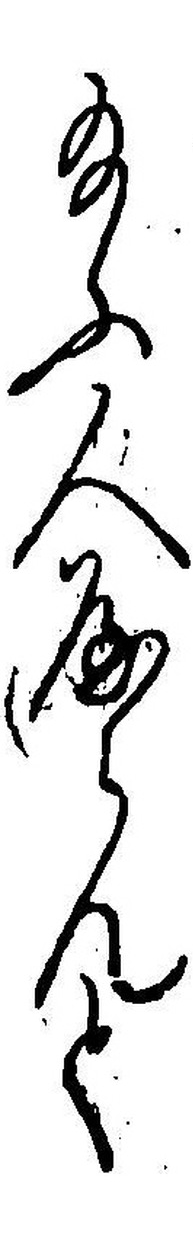給ふ人やらんと
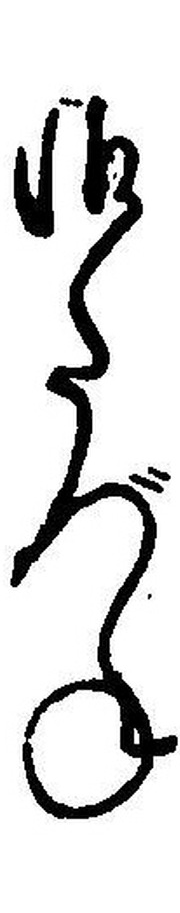御たづね
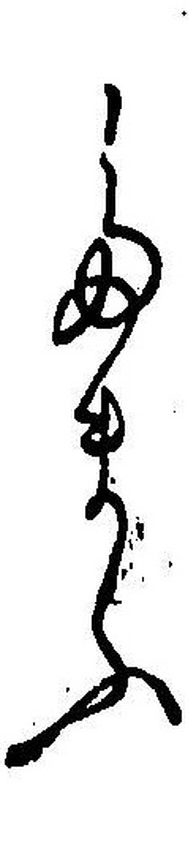たまふ

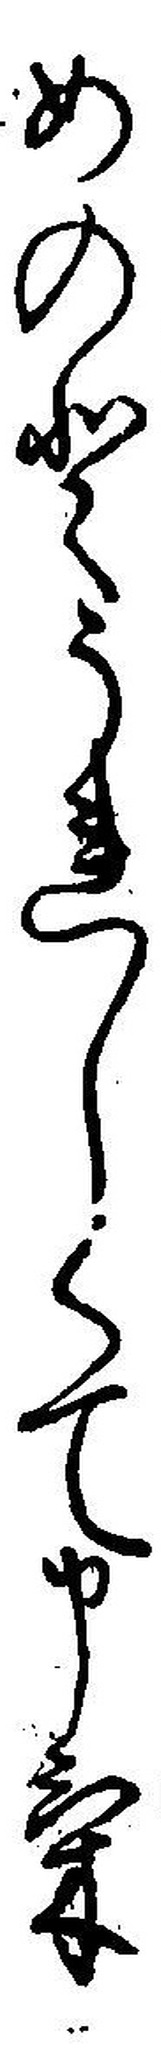めのとうれしくて申け
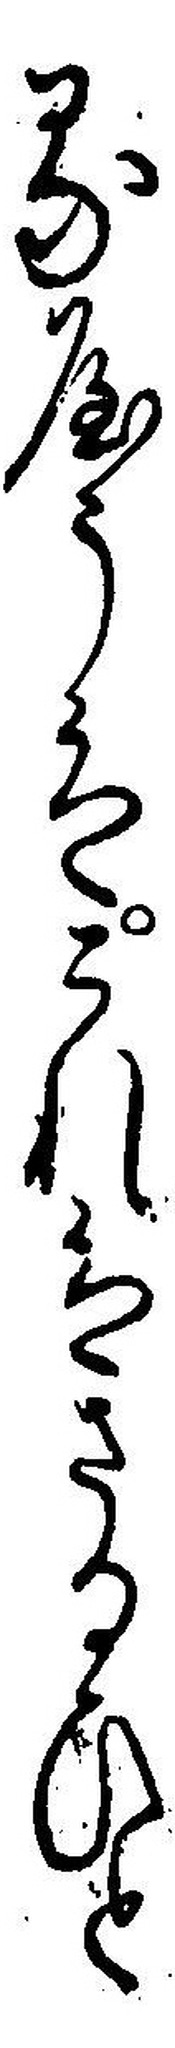るやうは。これはさるひと
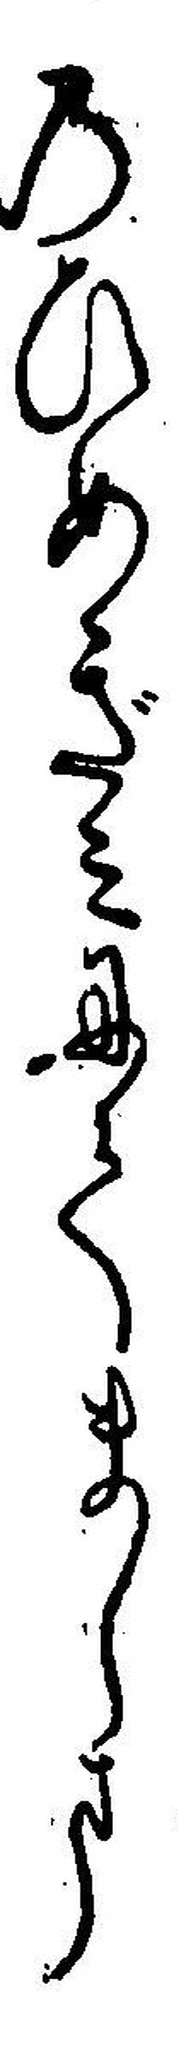のひめぎみにてましま
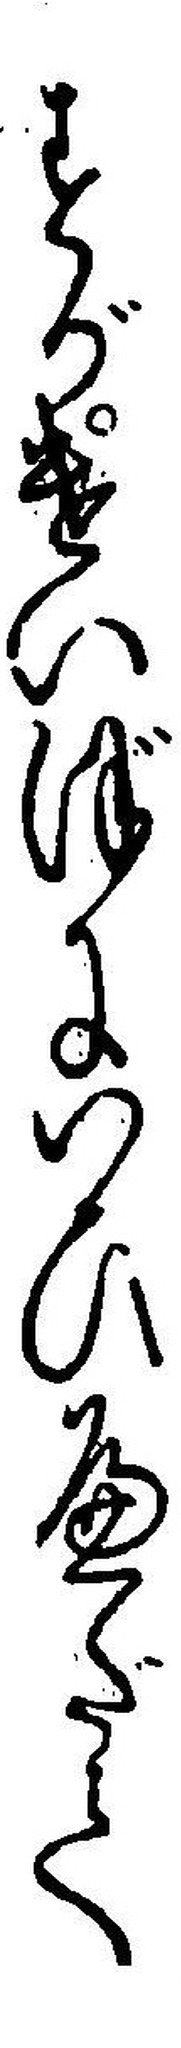すが。けいぼにいひへだて
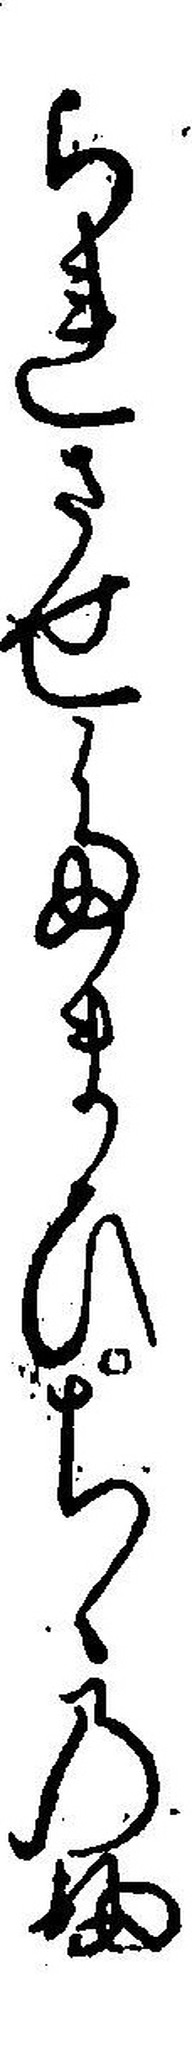られさせたまひ。ちゝのふ
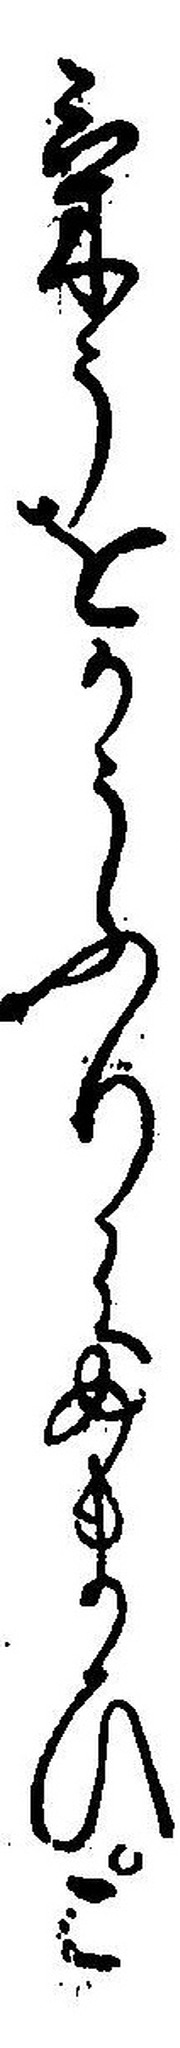けうをかうふりたまひ。こ
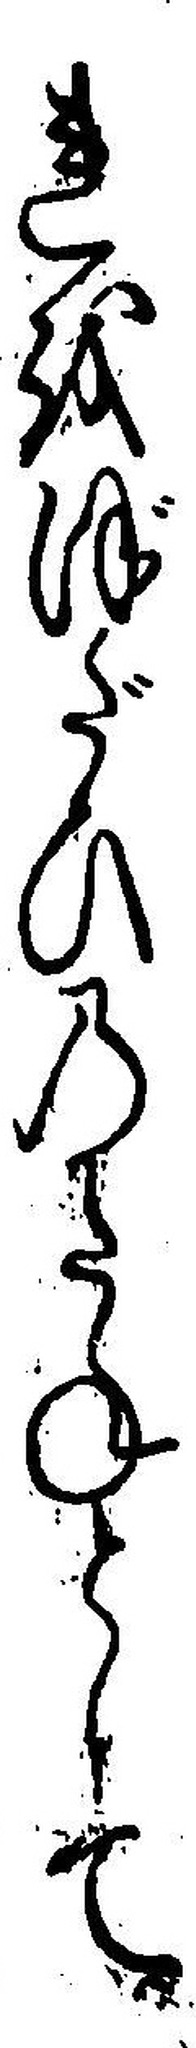れをぼだひのたねとして。
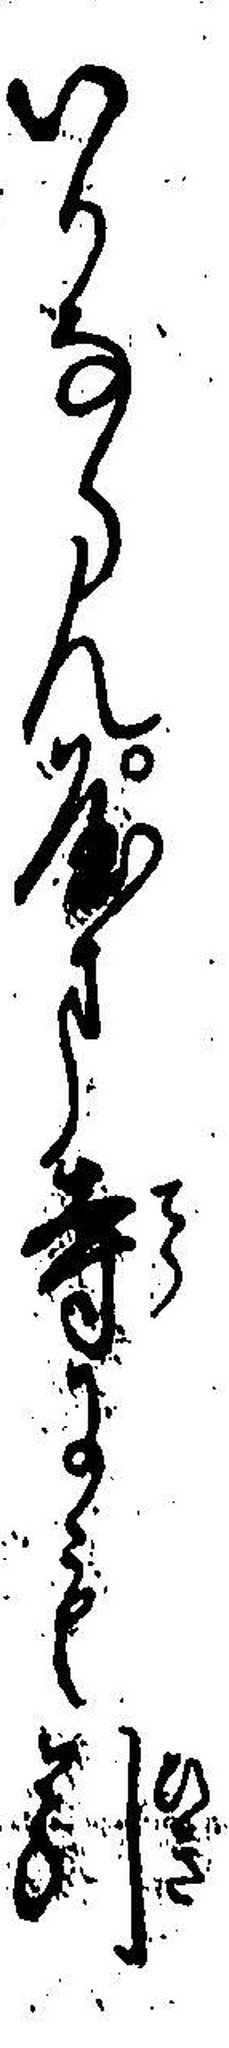いかならん。やま寺にも引
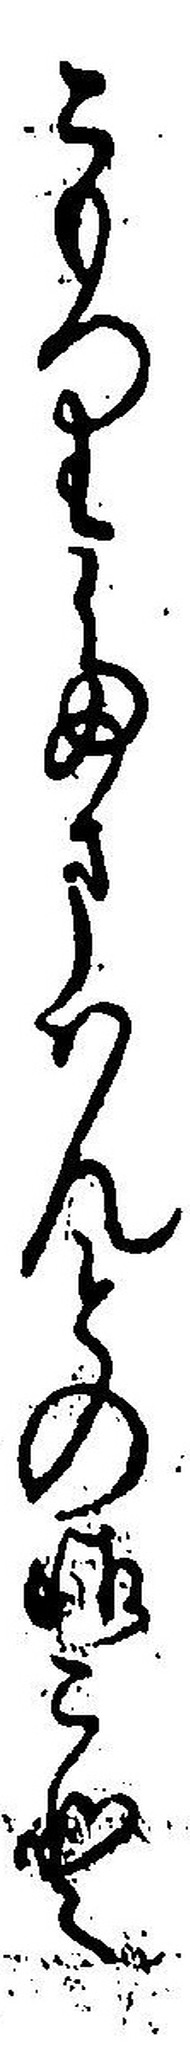こもりたまはんとの御こと
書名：木幡きつね
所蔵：東京大学総合図書館 General Library in the University of Tokyo, JAPAN
